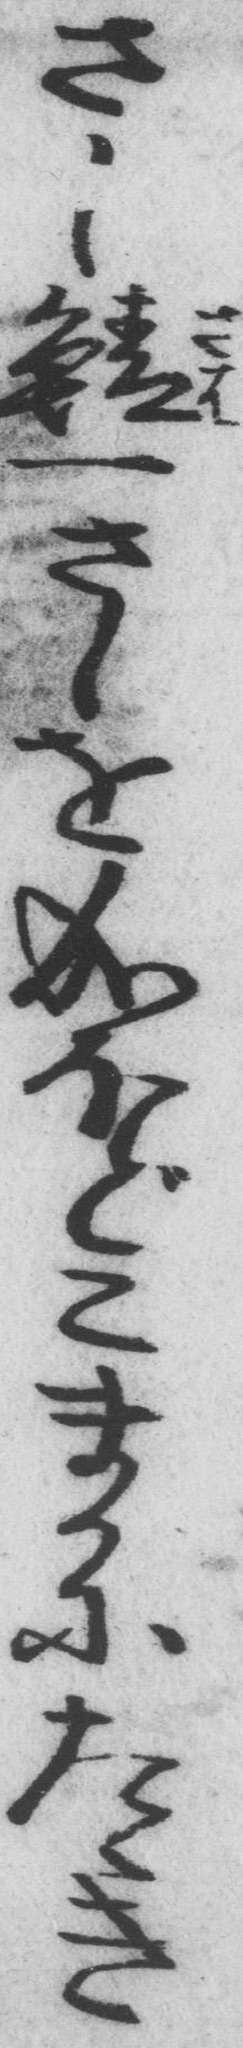さし鯖一さしを成ほどこまかにたゝき
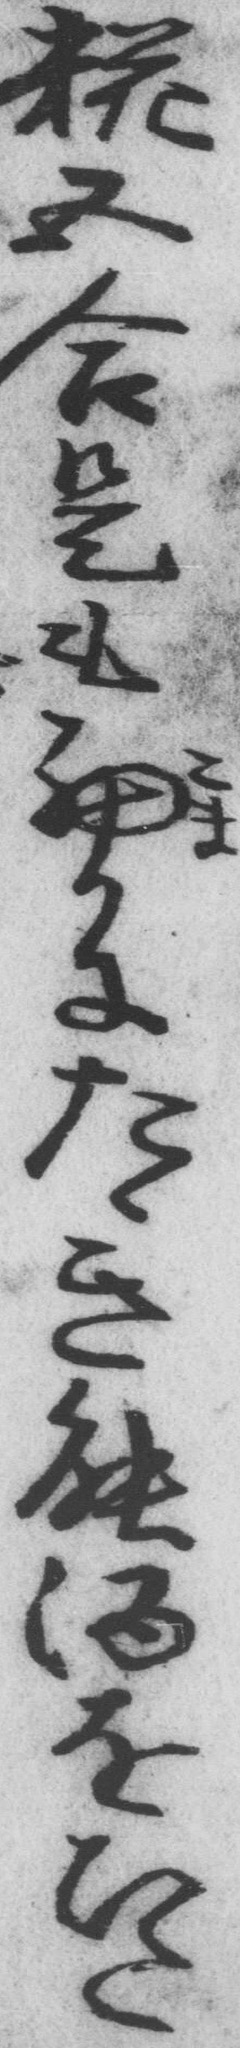糀五合是も細かにたゝき能酒をひた
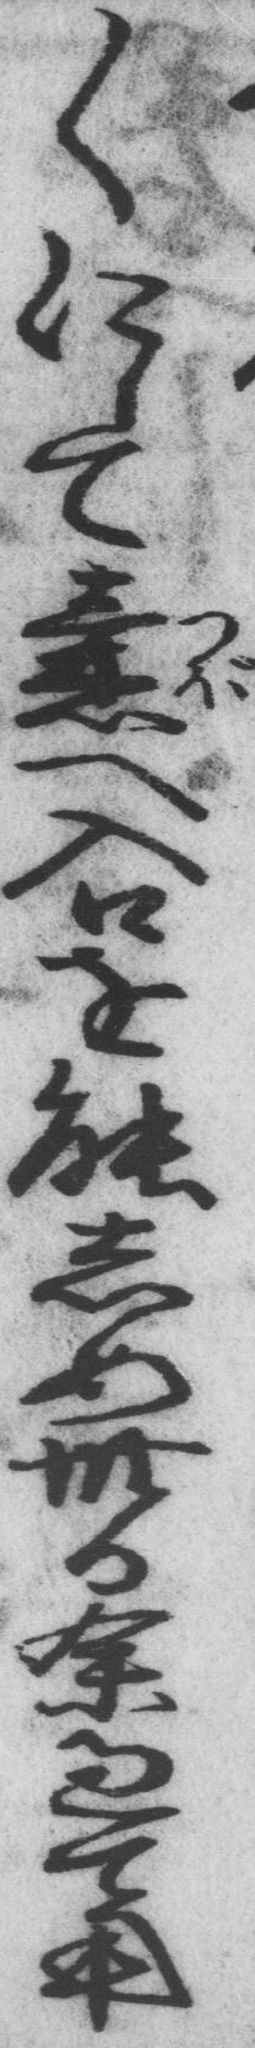〳〵にして壺へ入口を能しめ卅日余過て用
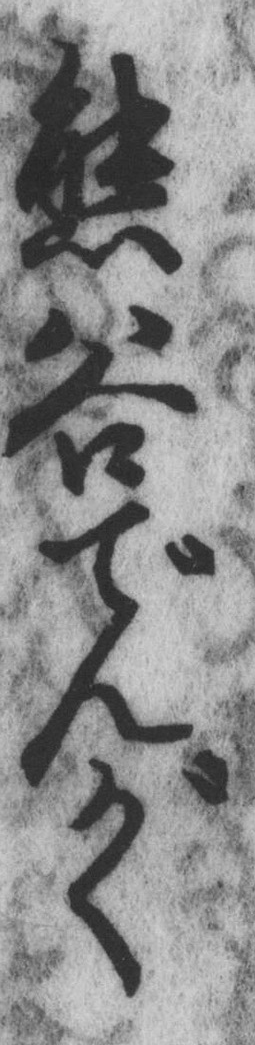熊谷でんがく

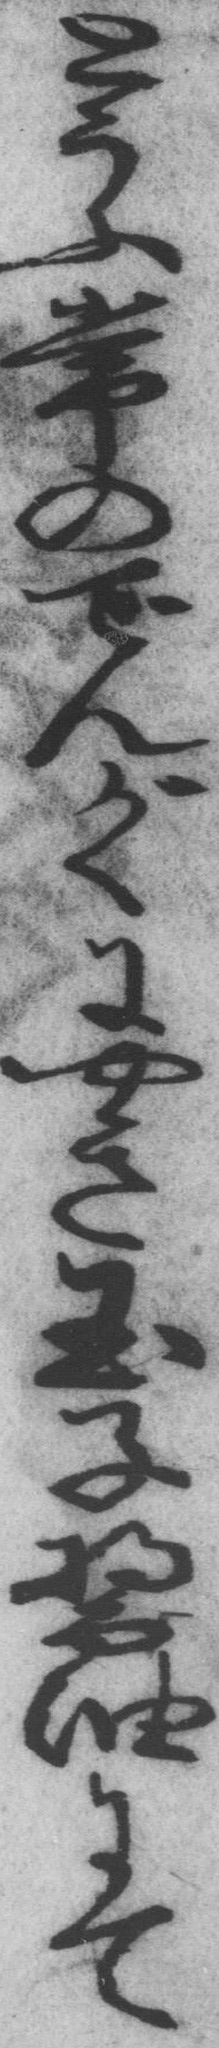とうふ常のでんがくにやき玉子醤油にて
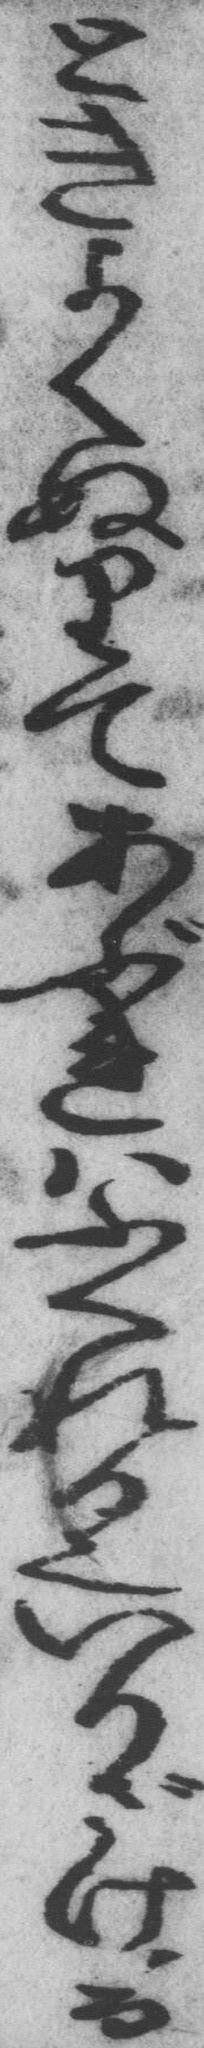ときよくぬりてあぶれはふくれる也いりざけにて
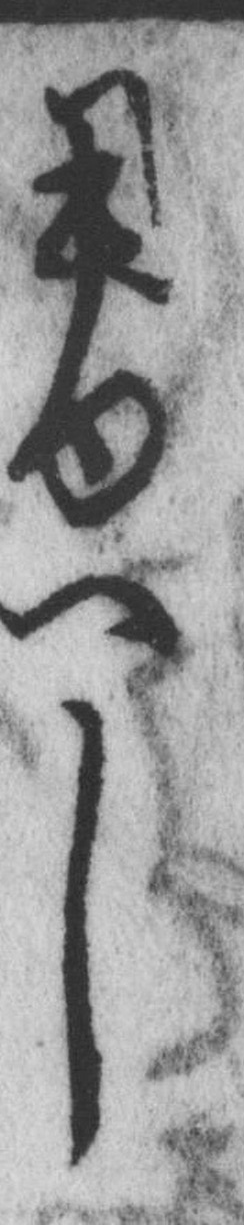用ゆべし
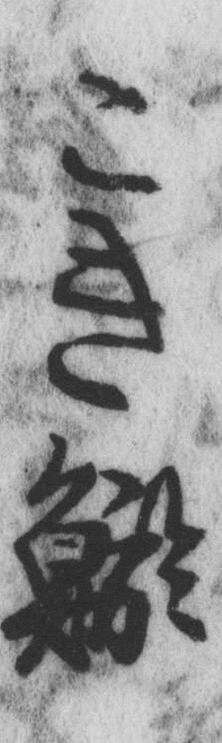こき鯲
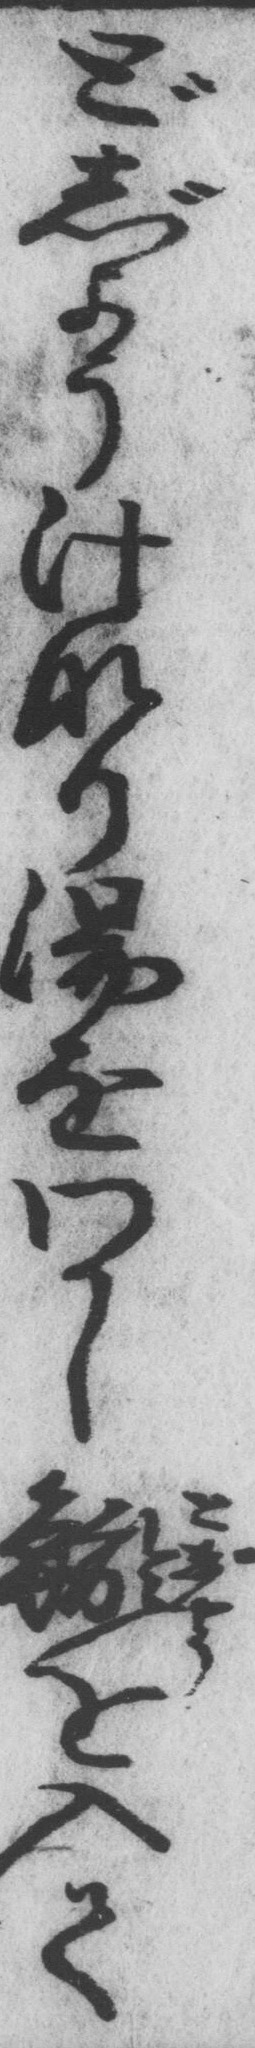どじよう汁なり湯をわかし鯲を入て
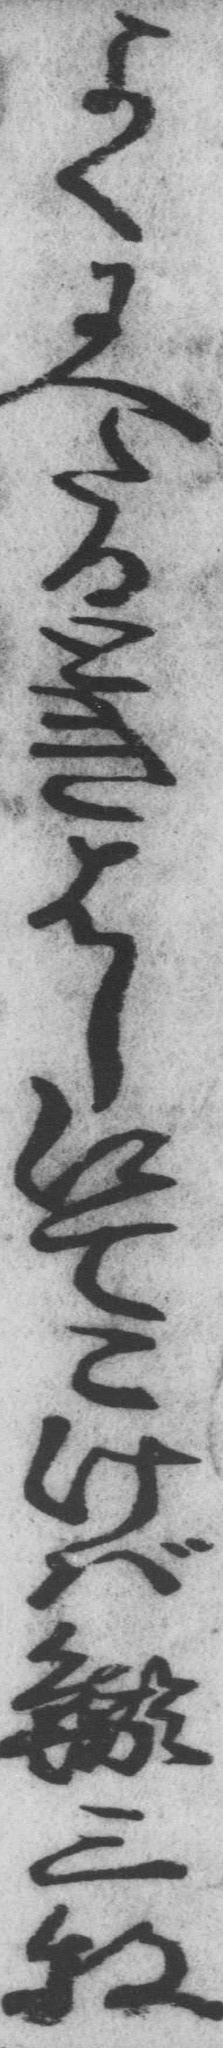よくにへたるときはしにてこけば鯲三枚
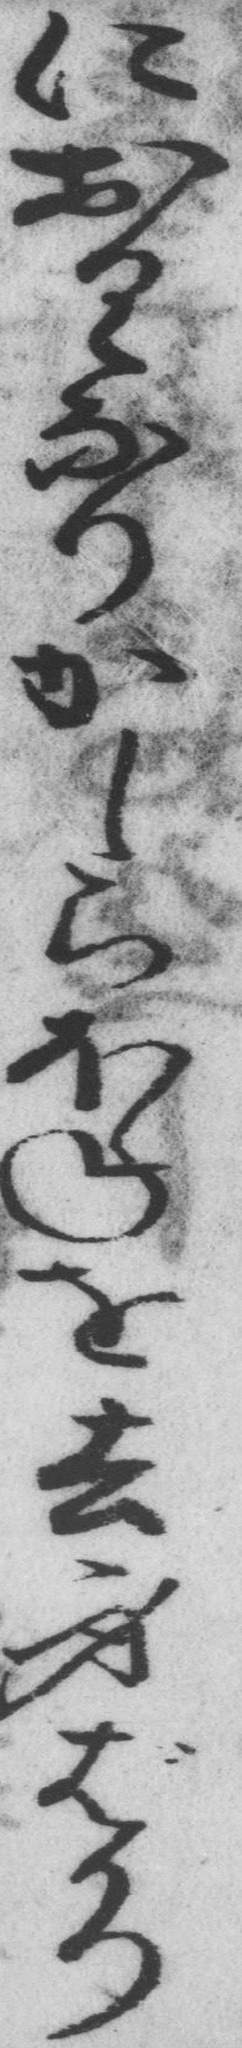におるゝなりかしらほねを去身ばかり
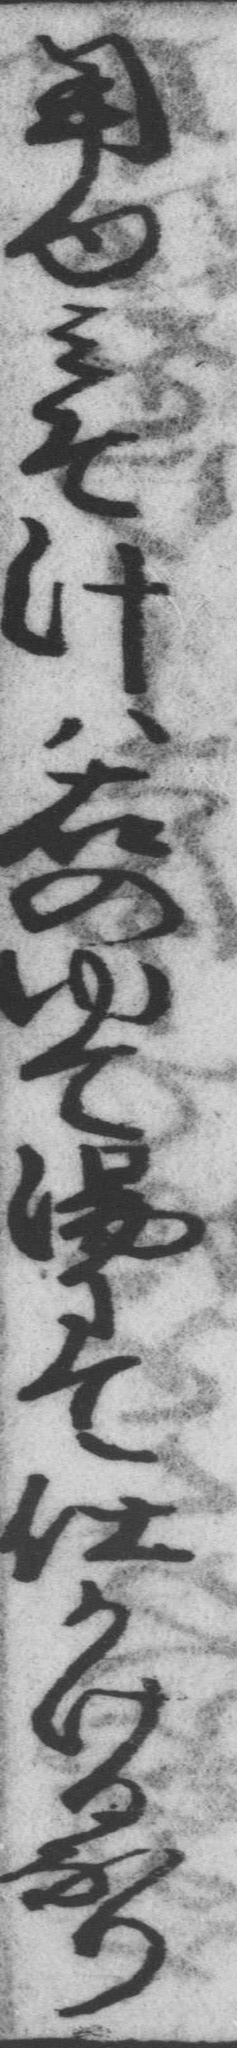用ゆみそ汁は右のゆて湯にて仕かけるなり
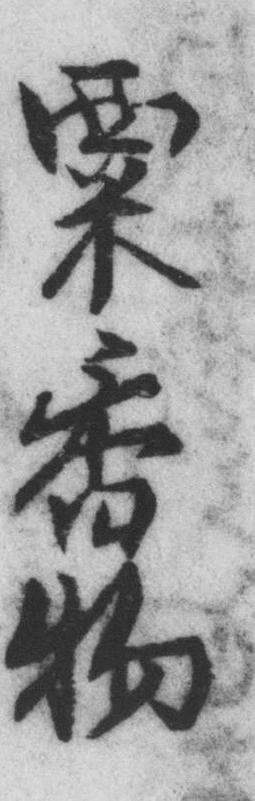粟香物
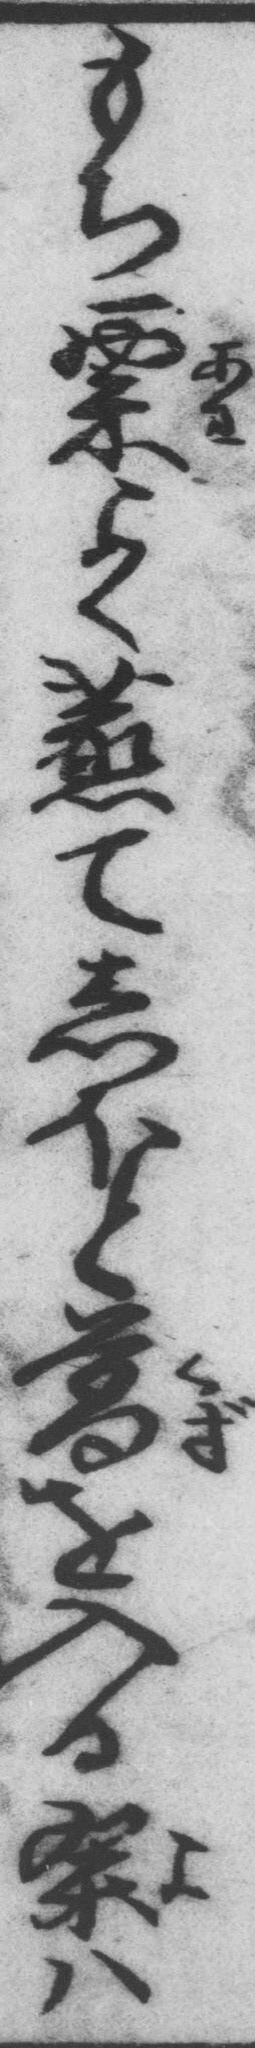もち粟よく蒸てしほと葛を入る余は
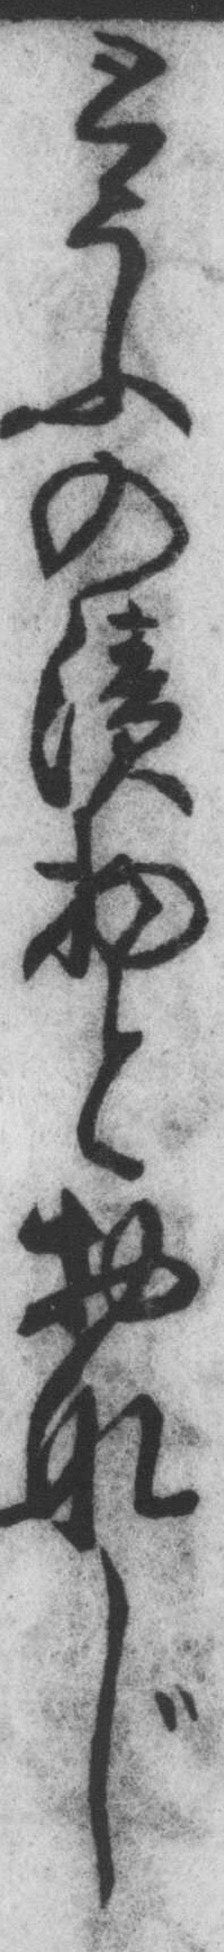とうふの漬物とおなじ
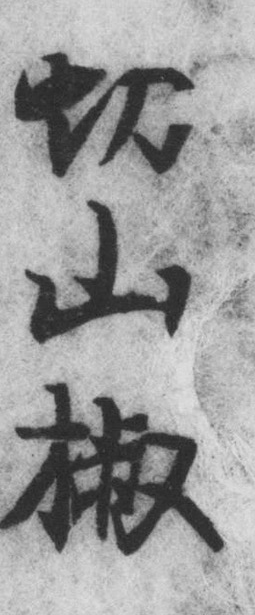切山椒
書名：料理山海郷
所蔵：大阪府立大学学術情報センター 国文学研究資料館
